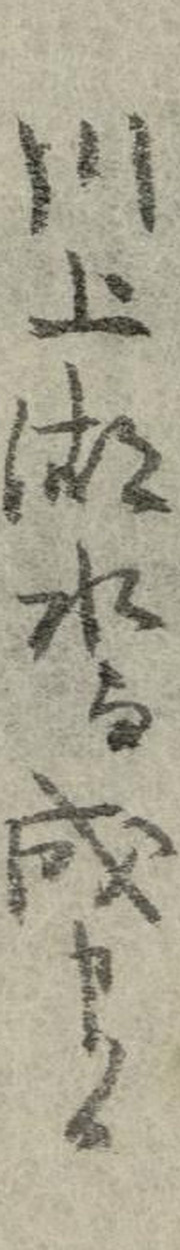川上湖水と成申候
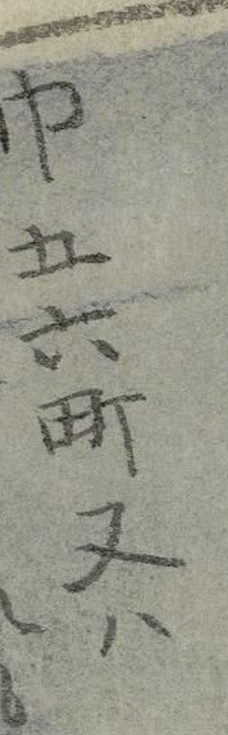巾五六町又ハ

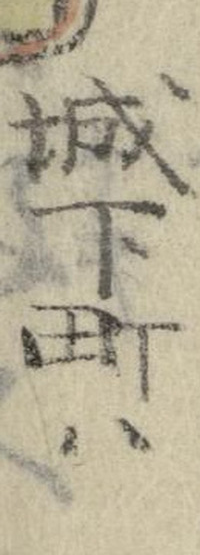城下町は
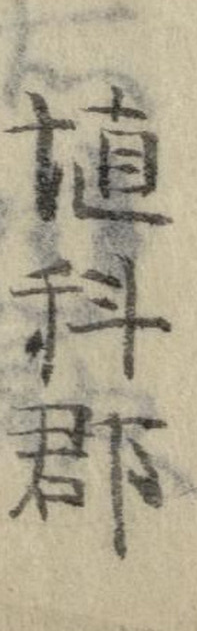埴科郡
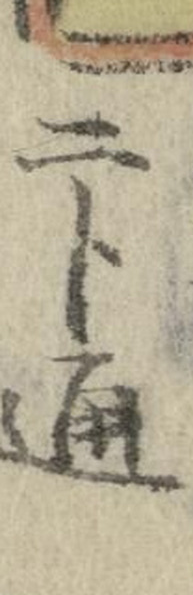二分通
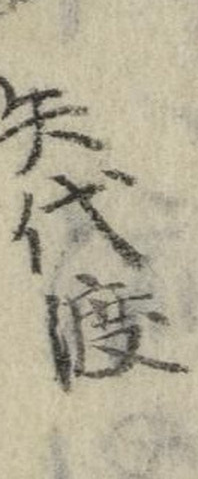矢代渡
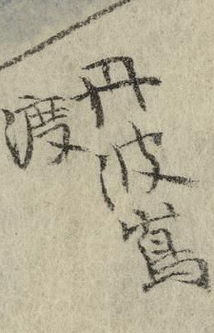丹波嶌
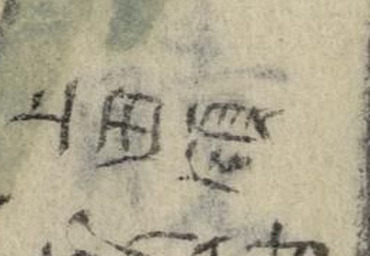上田領
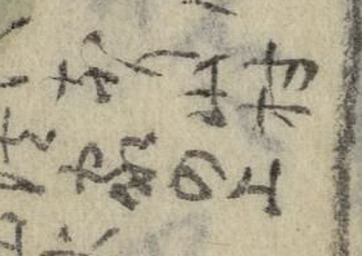潰家の上
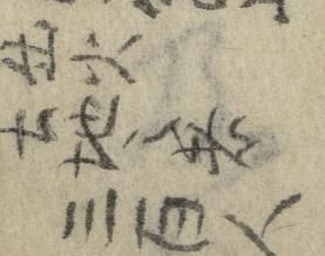土地の者
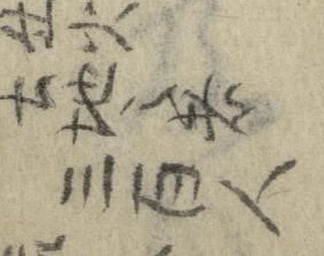土地の者
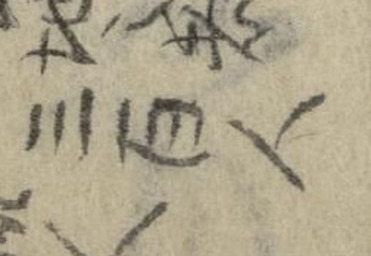三百人
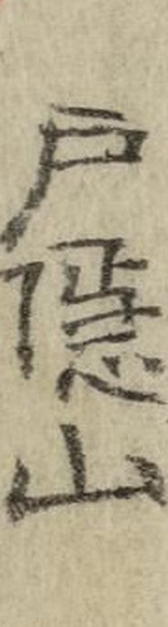戸隠山
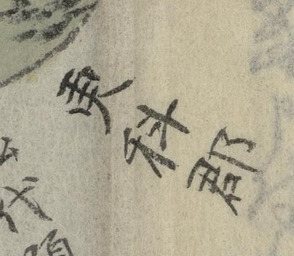埴科郡
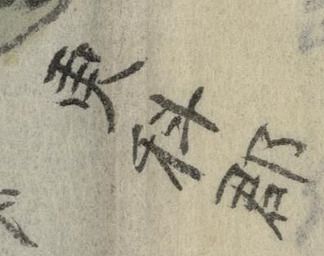埴科郡
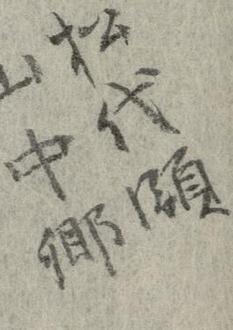山中郷
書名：[善光寺地震被害書上]
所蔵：東京大学地震研究所図書室 Earthquake Research Institute Library, The University of Tokyo, JAPAN
